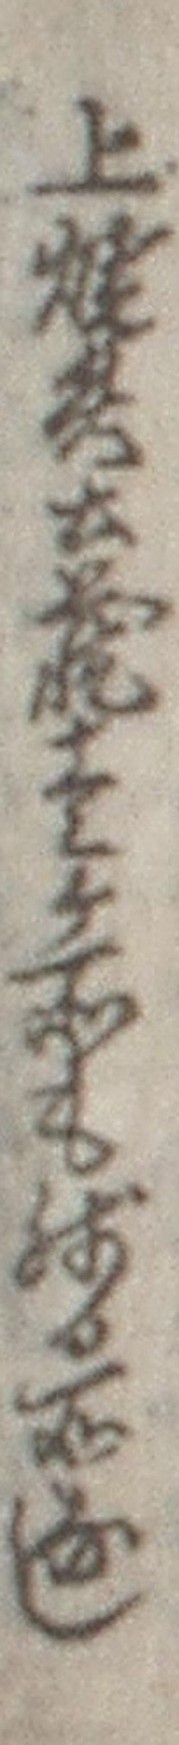上焼失土蔵壱ケ所も残る所なし
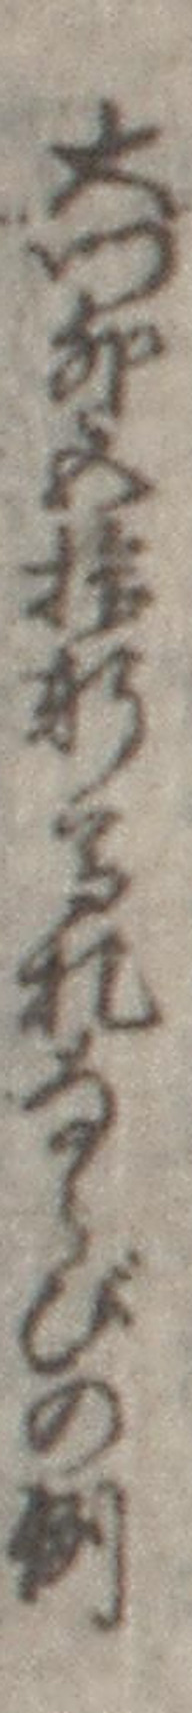大門外五拾軒高札ならびの例
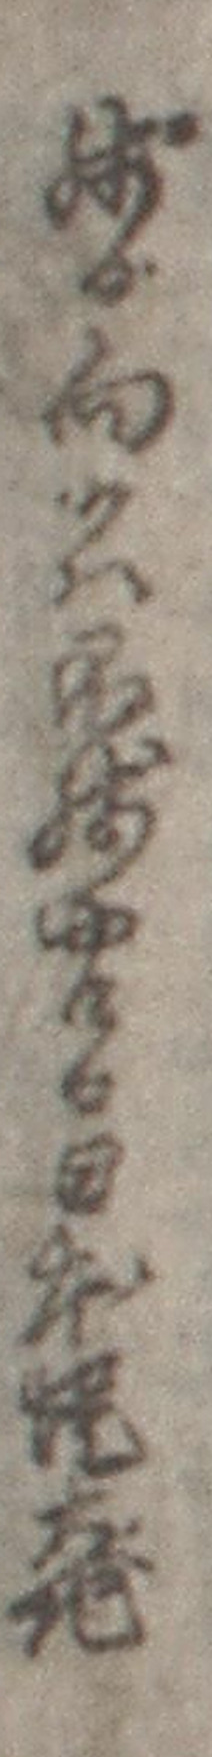残る向かは不残やける日本堤大地

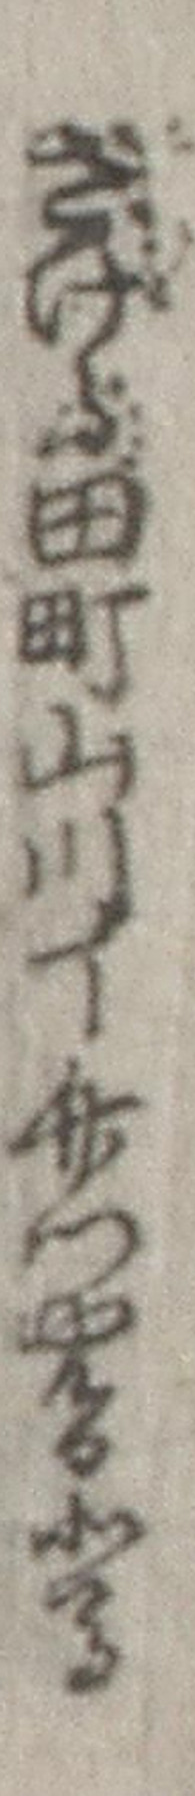さける田町山川丁此門やける北馬
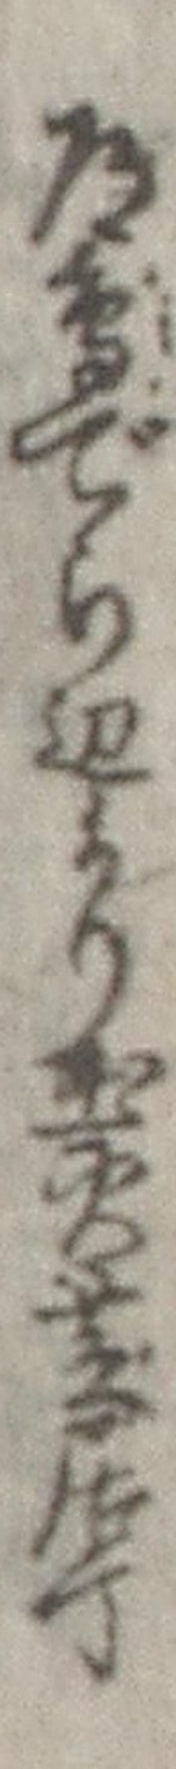道鳥でら辺より出火芝居丁
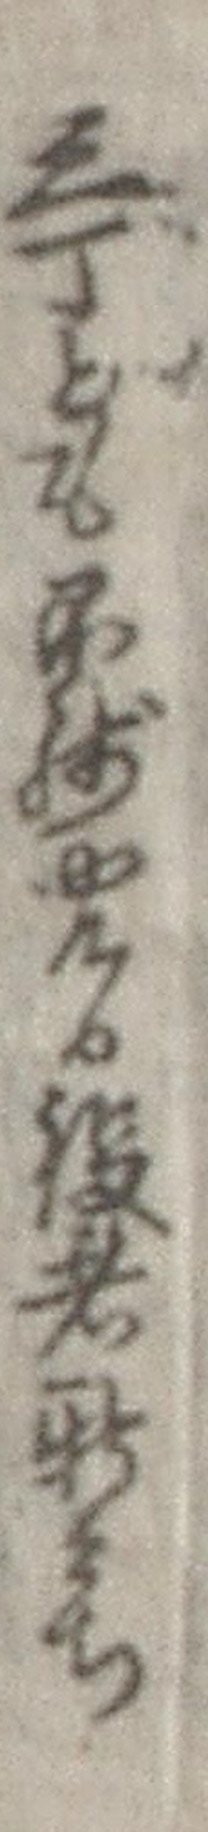三丁とも不残やける般若新まち
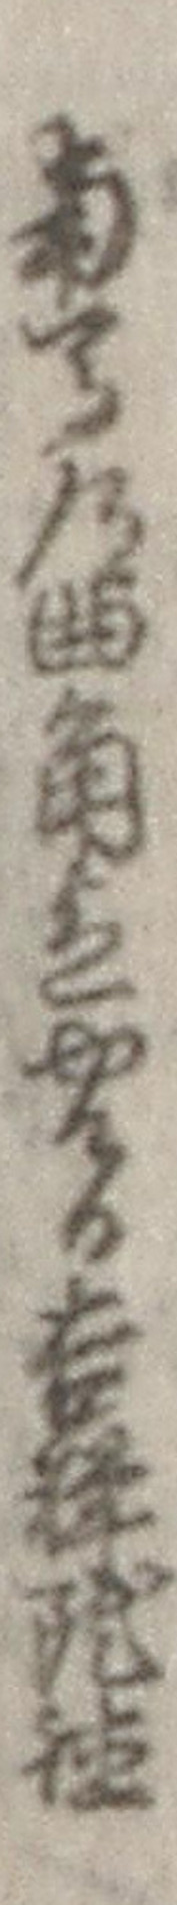南馬道曲角迄やける吉祥院徳
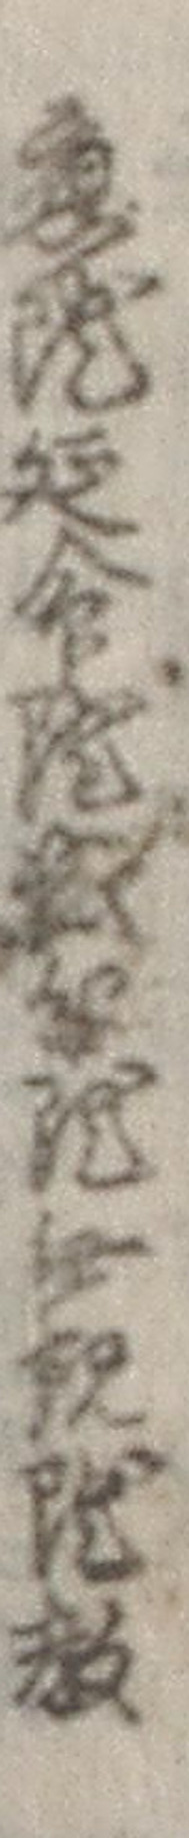応院延命院誠心院無観院教
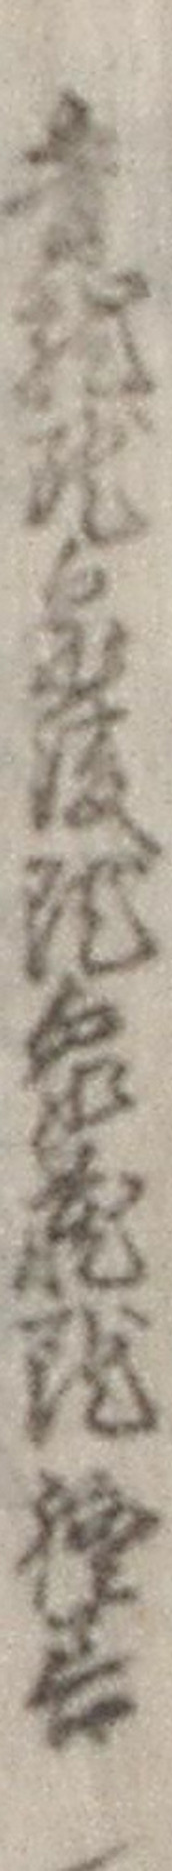青龍院泉凌院泉蔵院修善
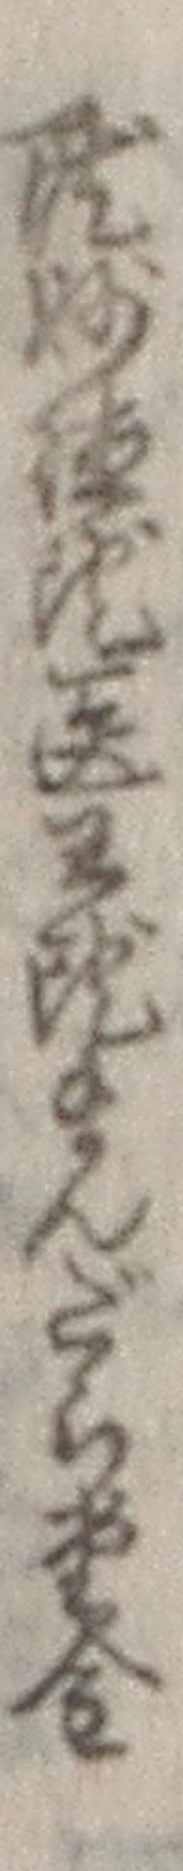院妙徳院医王院まんだら堂金
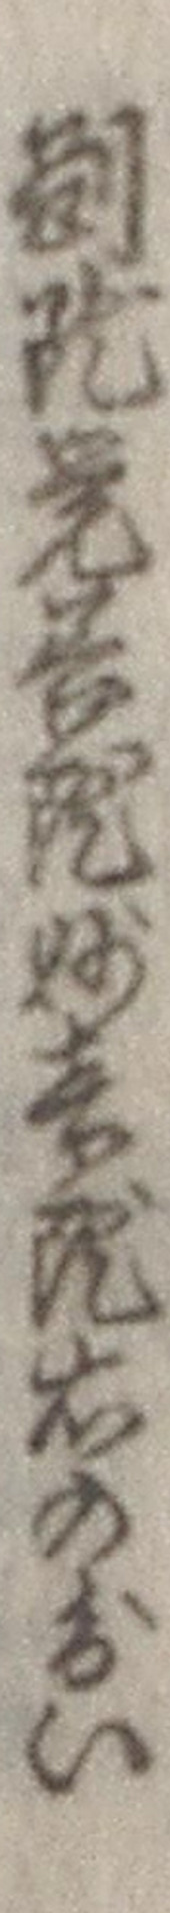剛院覚善院妙意院右の分い
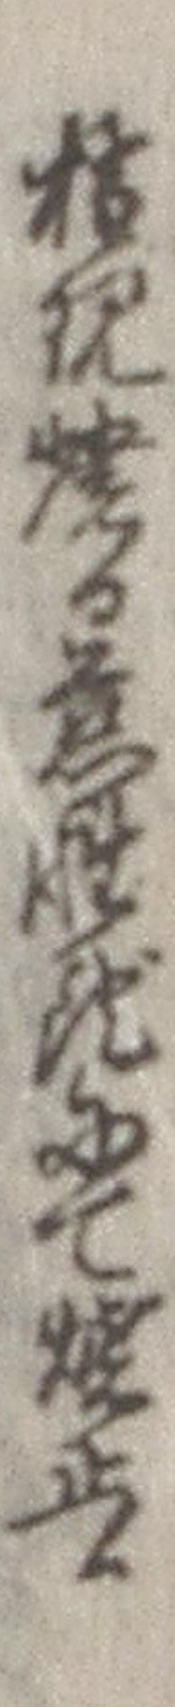権現焼る慈性院にて焼止る
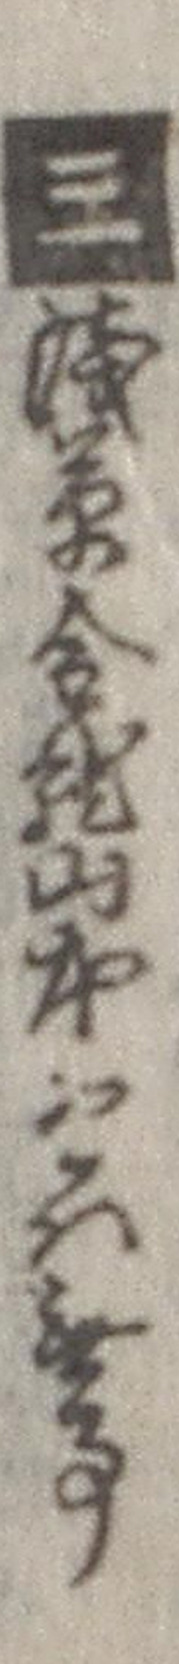三浅草金龍山本堂は無事
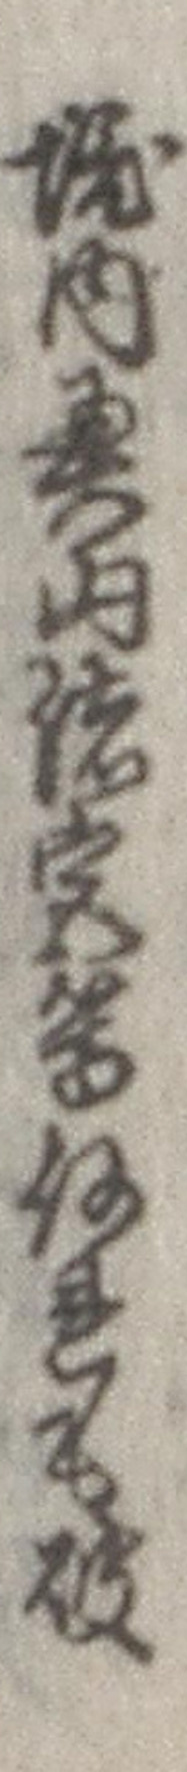境内奥山諸宮等何れも破
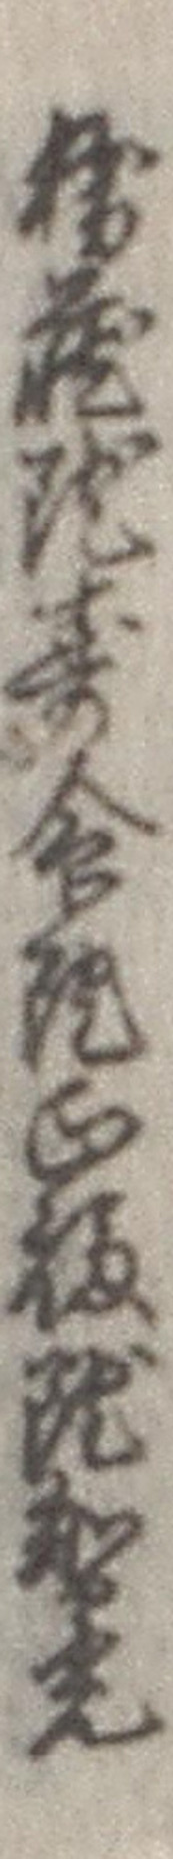勝蔵院寿命院正福院智光
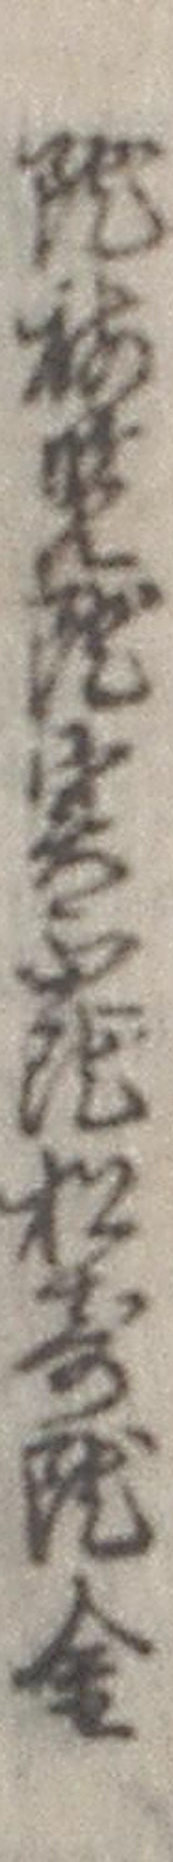院梅覧院実正院松寿院金
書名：江戸　大地震臣細録　全
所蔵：東京大学地震研究所図書室 Earthquake Research Institute Library, The University of Tokyo, JAPAN
